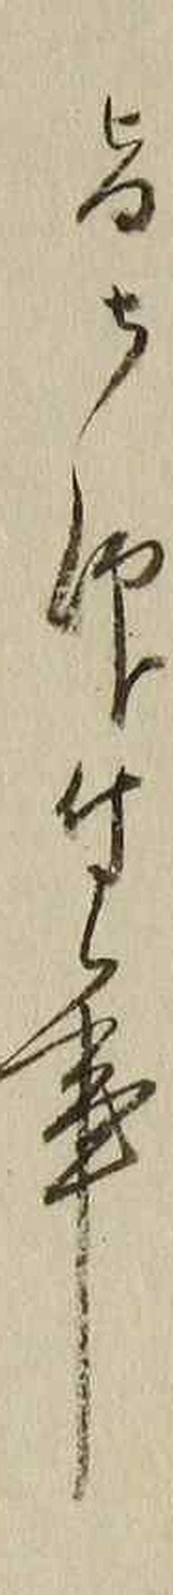旨被仰付候事
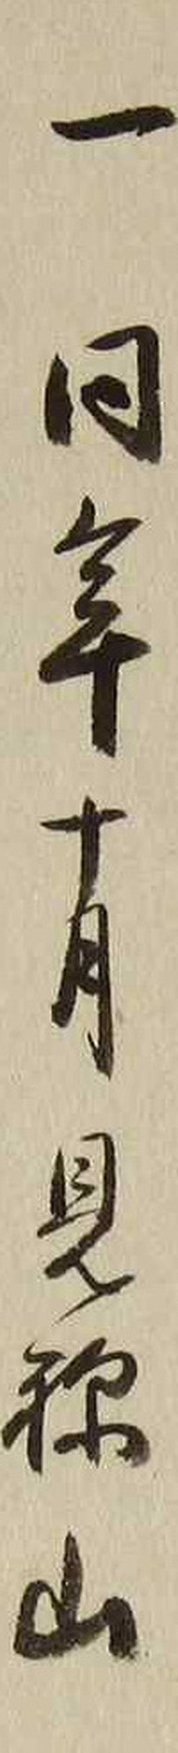一同年十月見祢山
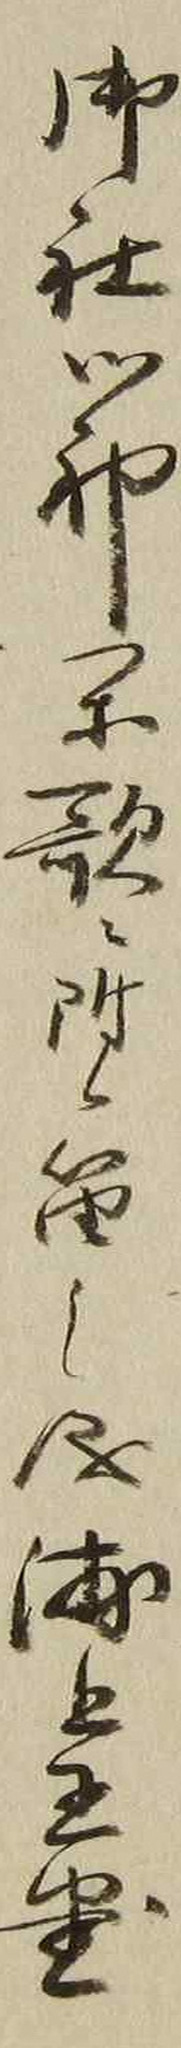御社御神楽歌ニ附候笛之儀浦上玉堂
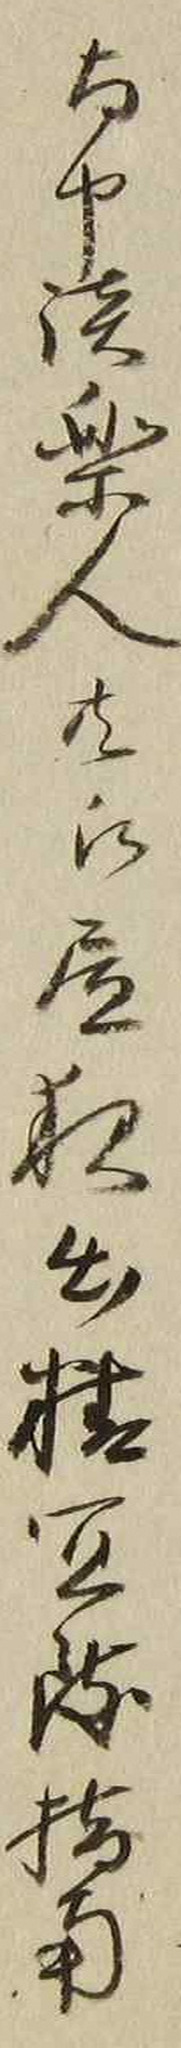与申談楽人共江昼夜出精宜致指南
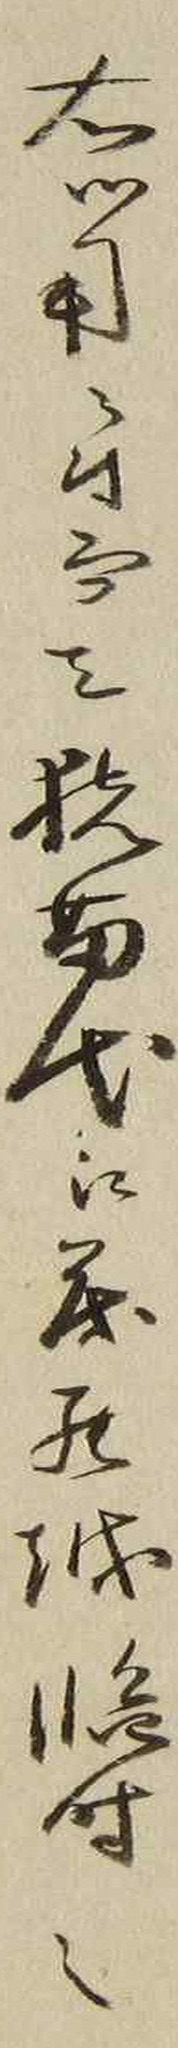右御用ニ付而者猪苗代江茂罷越臨時之
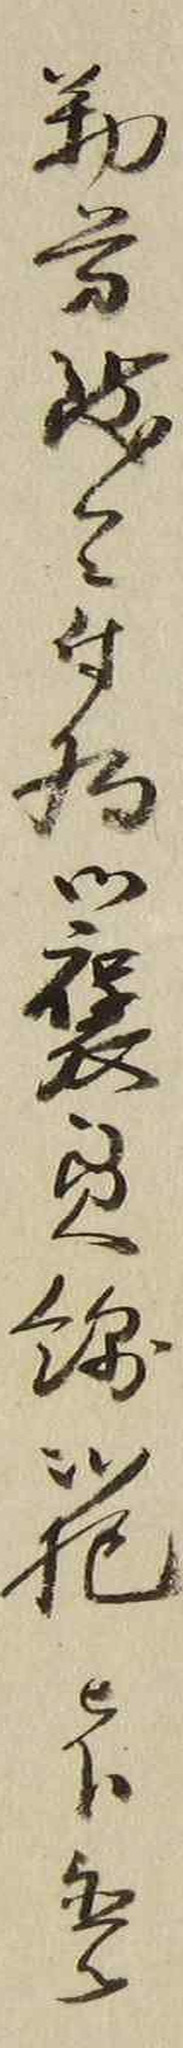勤方致候ニ付為御褒美綿弐把被下置候
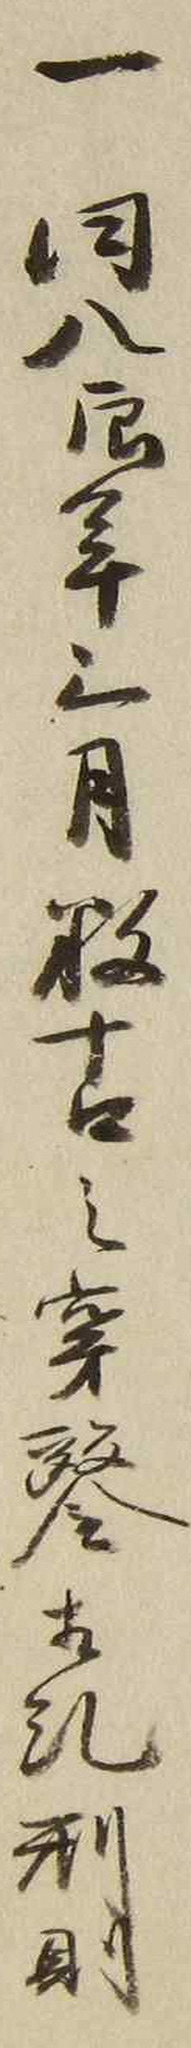一同八辰年三月数十口之穿鑿相糺刑則

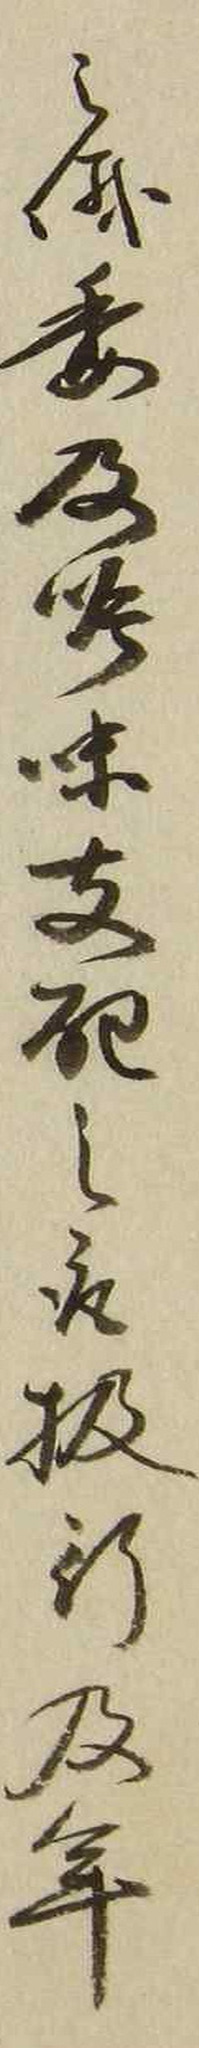之儀委及吟味支配之取扱行及年
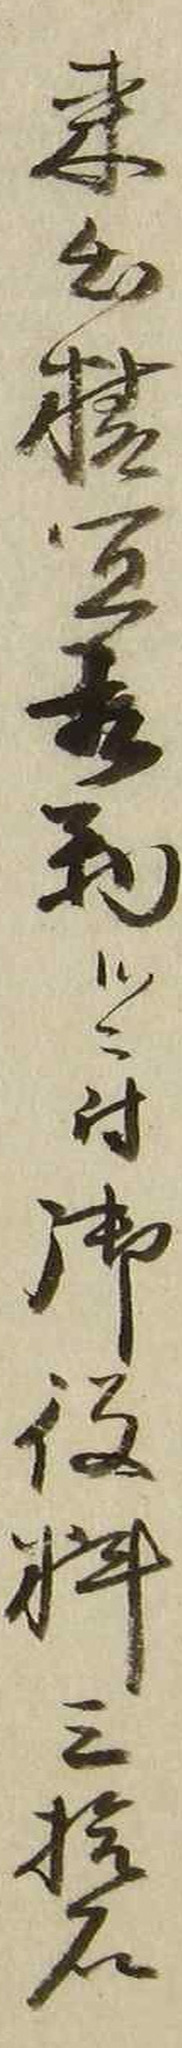来出精宜相勤候ニ付御役料三拾石
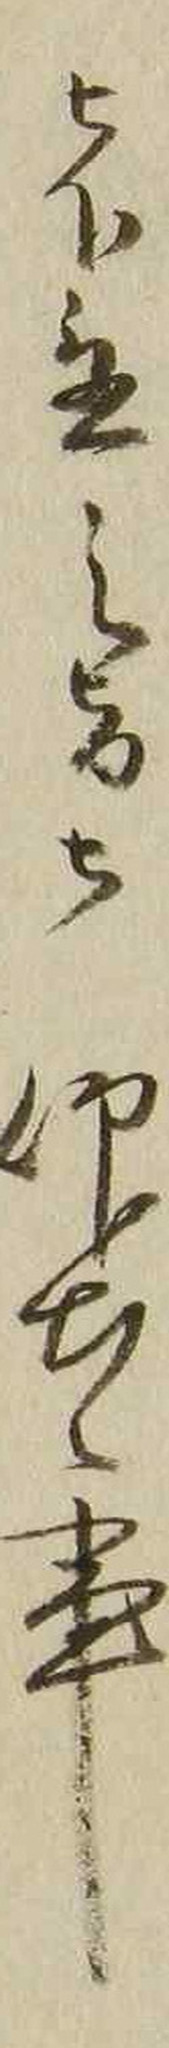被下置之旨被仰出候事
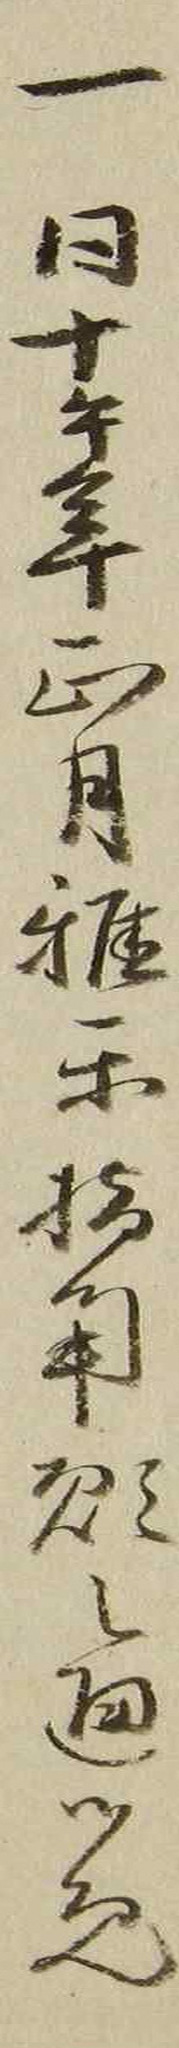一同十午年正月雅楽指南願之通御免
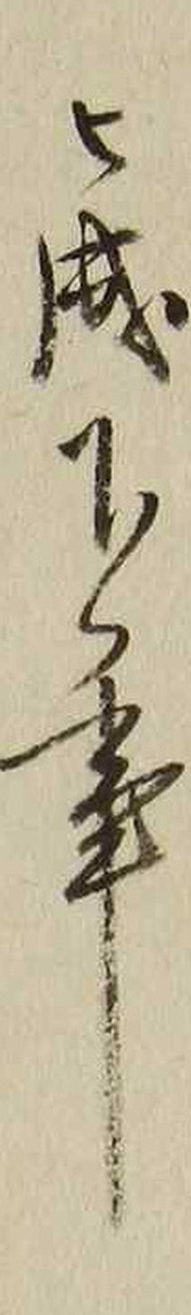被成下候事
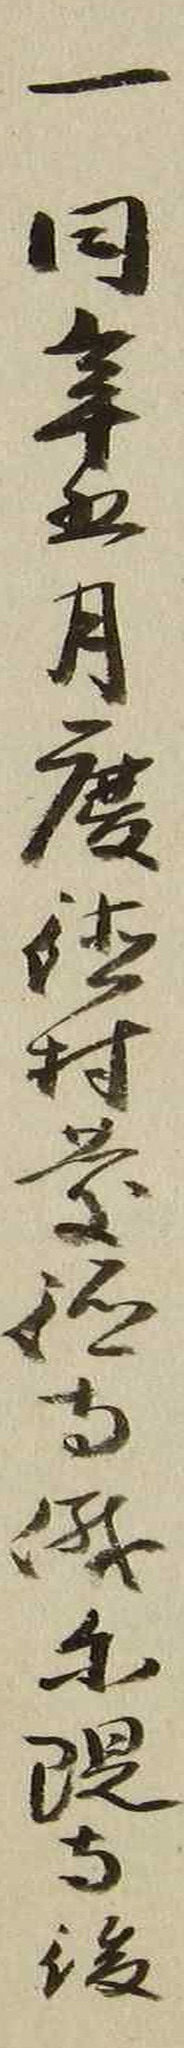一同年五月慶徳村慶徳寺俄示現寺後
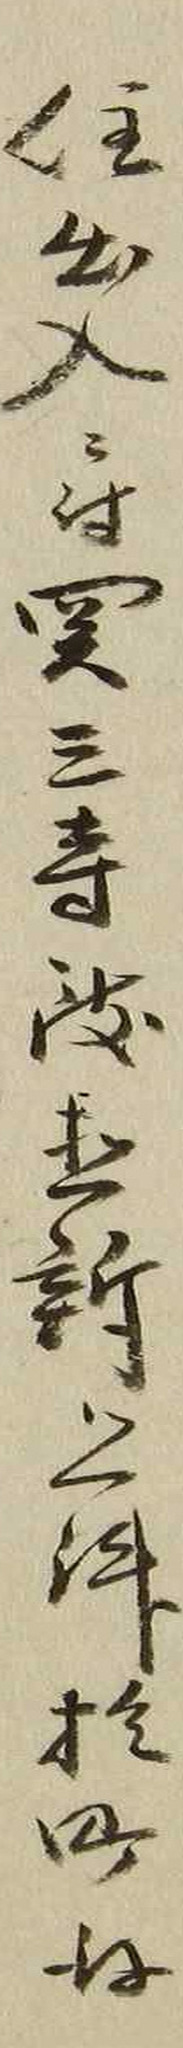住出入ニ付関三寺致直訴候一件於町役
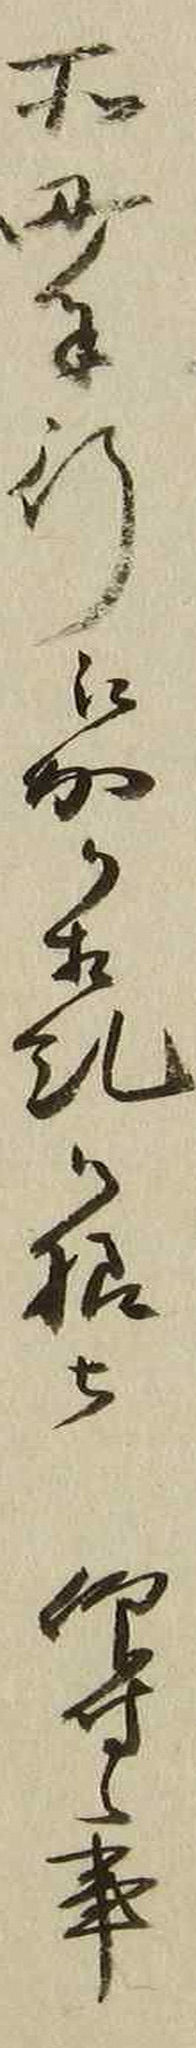所町奉行江かり相糺候様被仰付候事
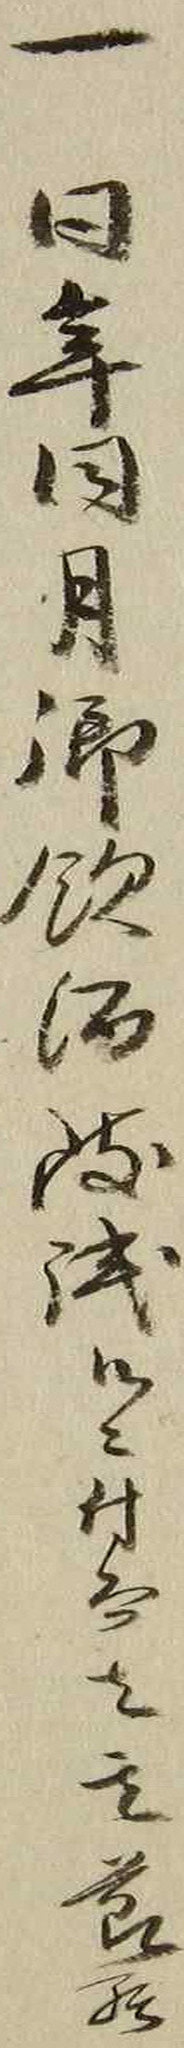一同年同月郷飲酒致試候ニ付而者其節罷
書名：諸士系譜　巻之261　あ之部14
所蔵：会津若松市立会津図書館
